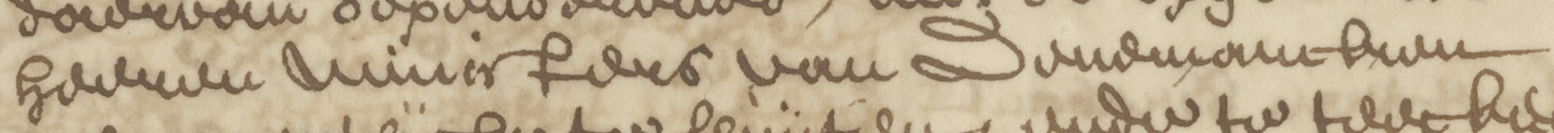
heeren Ministers van Denemarcken
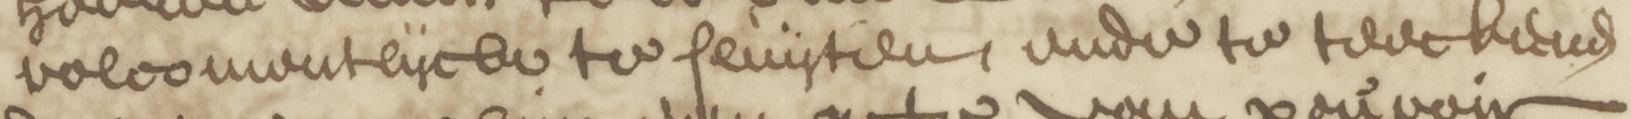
volcomentlijck te sluijten, ende te teeckenen
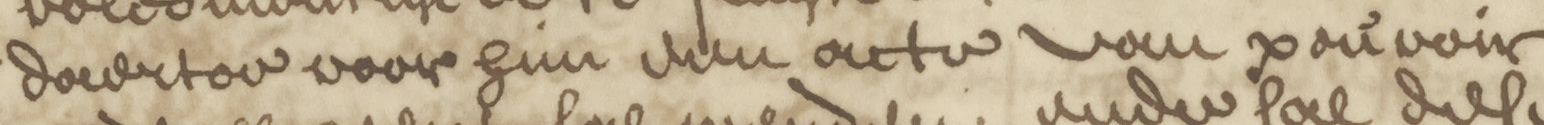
daertoe voor hun een acte van pouvoir
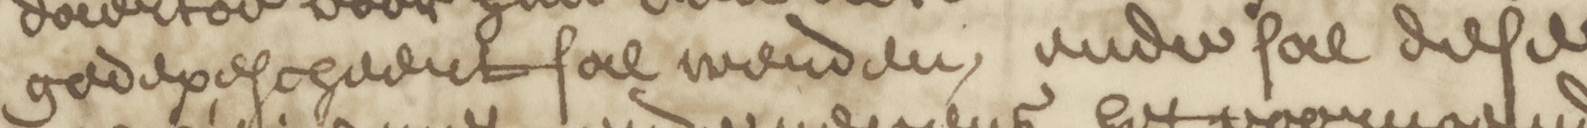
gedepescheert sal werden, ende sal dese
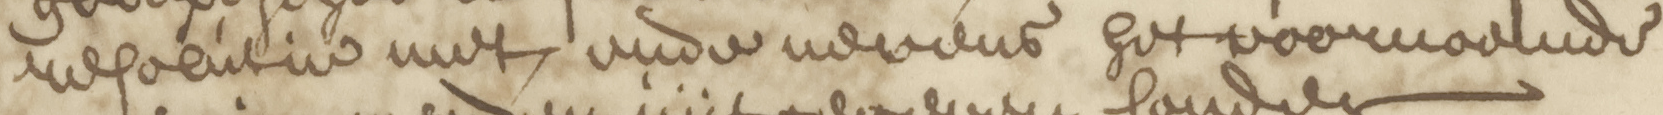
resolutie met, ende nevens het voornoemde
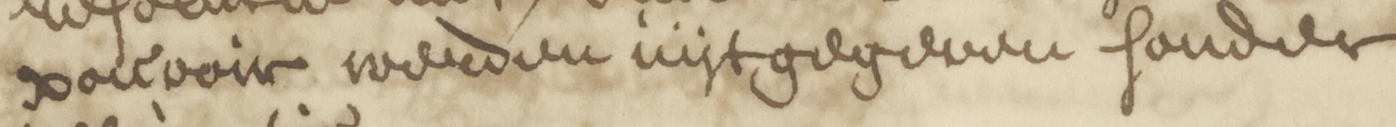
pouvoir werden uijtgegeven sonder
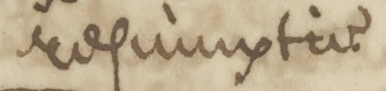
resumptie
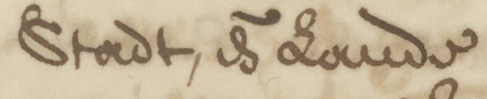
Stad, en Lande
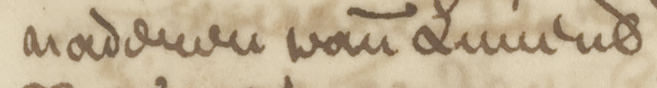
naderen van Lunenb
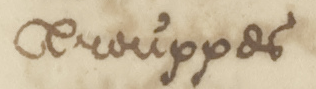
Trouppes
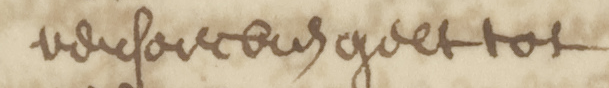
versoecken gelt tot
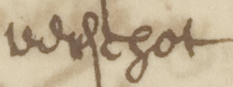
verschot
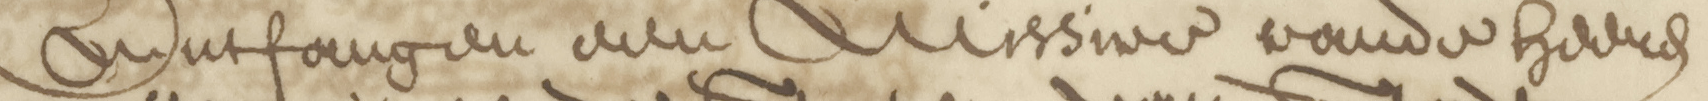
Ontfangen een Missive vande heeren
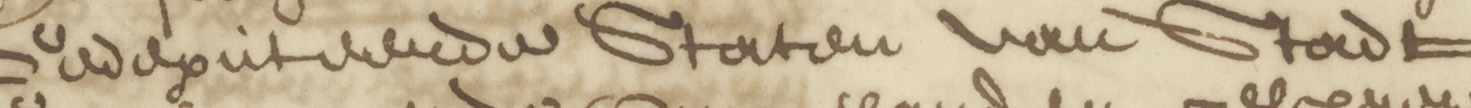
Gedeputeerde Staten van Stadt
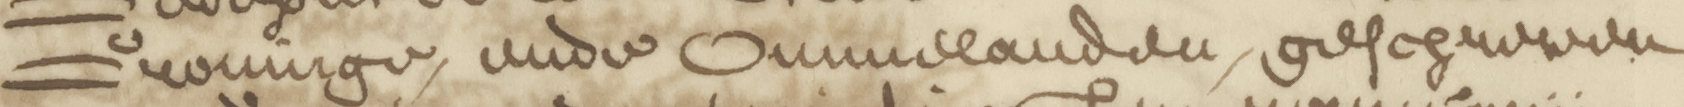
Groninge, ende Ommelanden, geschreven
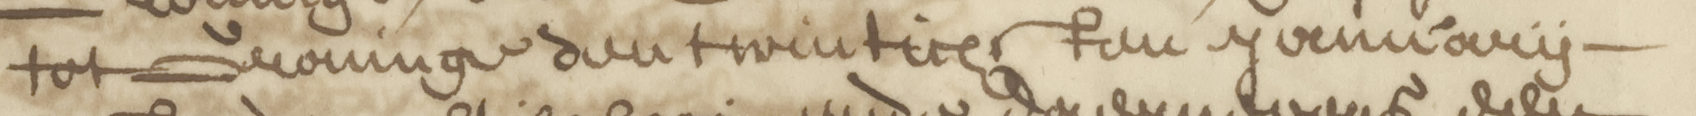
tot Groninge den twintichsten Januarij —
